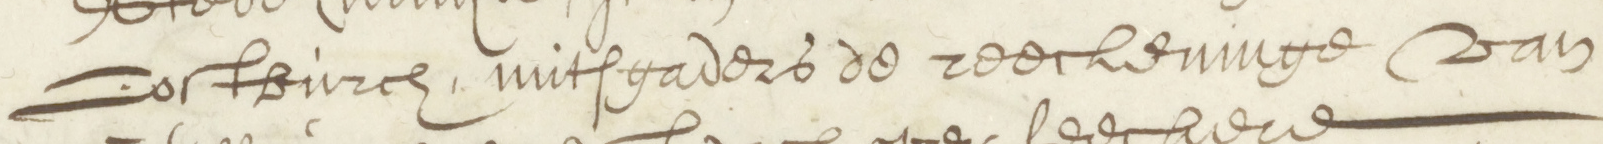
Oostburch, mitsgaders de reeckeninge van
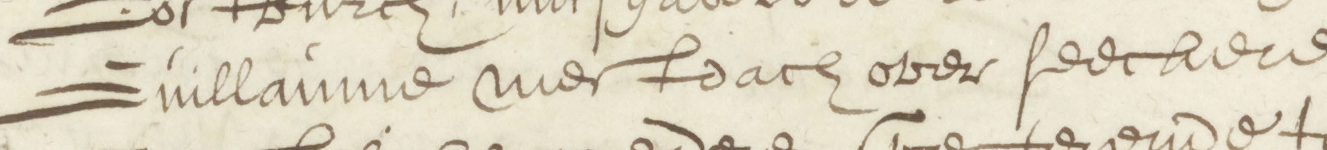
Guillaume mestdach over seeckere
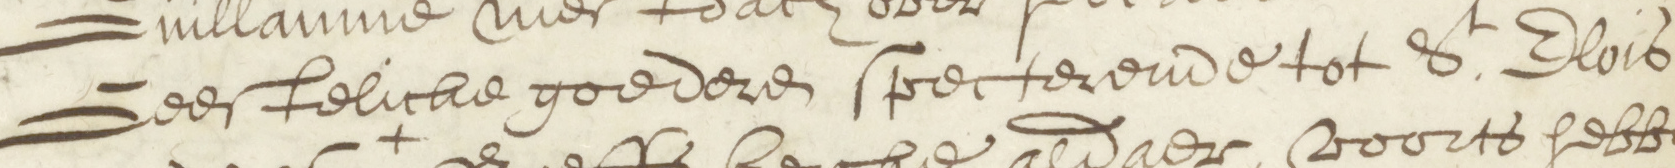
Geestelicke goederen specterende tot St. Elois
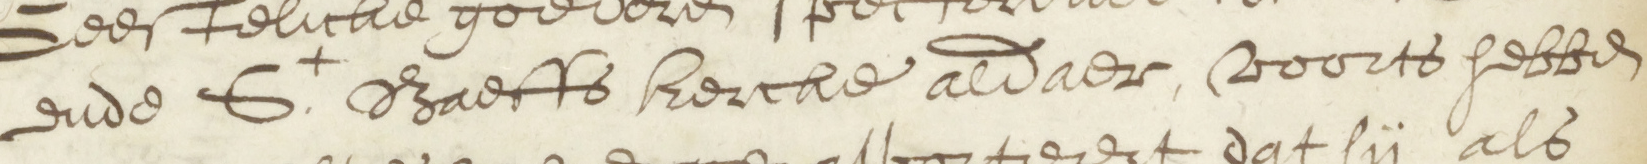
ende St. Baeffs kercke aldaer, voorts hebben
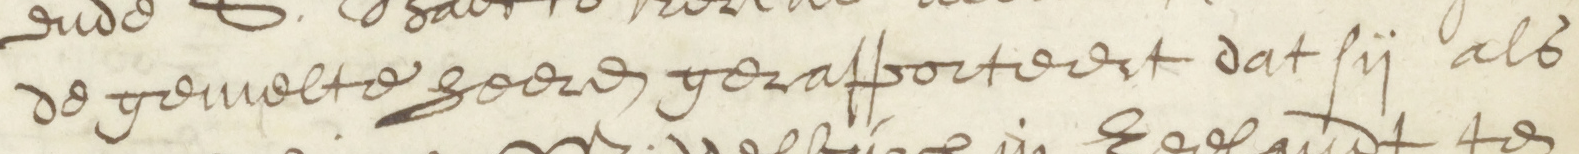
de gemelte heeren gerapporteert dat sij als
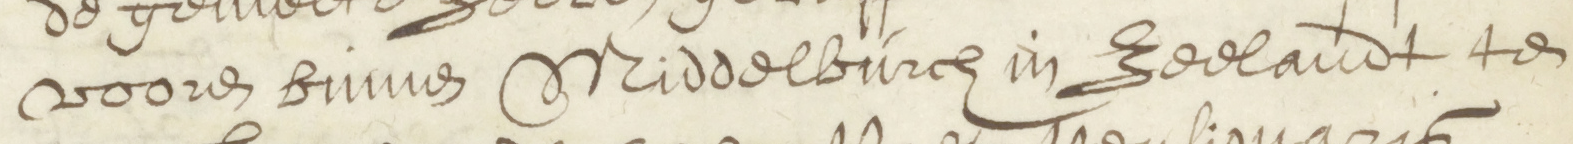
vooren binnen Middelburch in Zeelandt ten
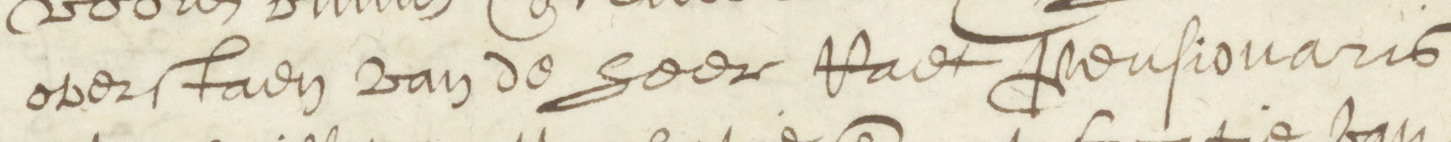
overstaen van de heer Raet Pensionaris
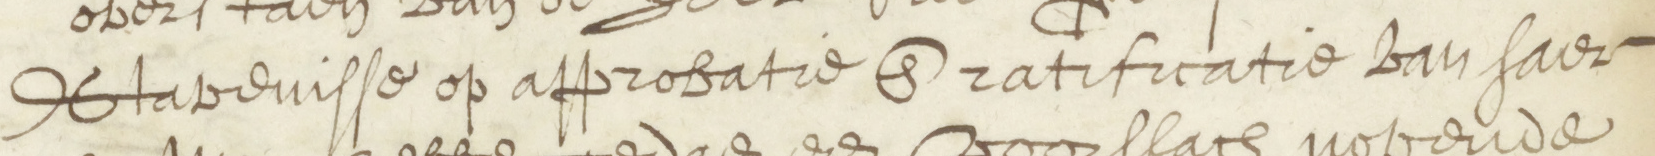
Stavenisse op approbatie & ratificatie van haer
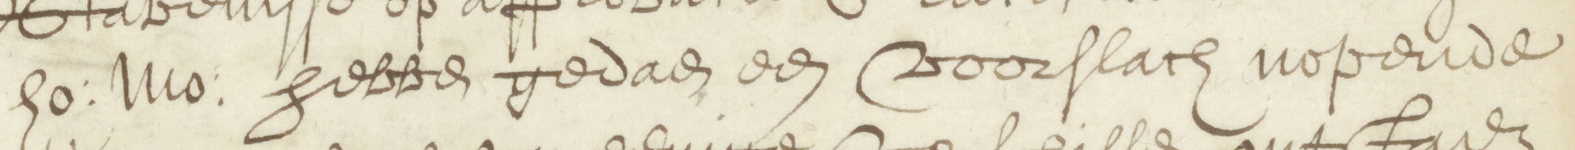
ho:Mo: hebben gedaen een voorslach nopende
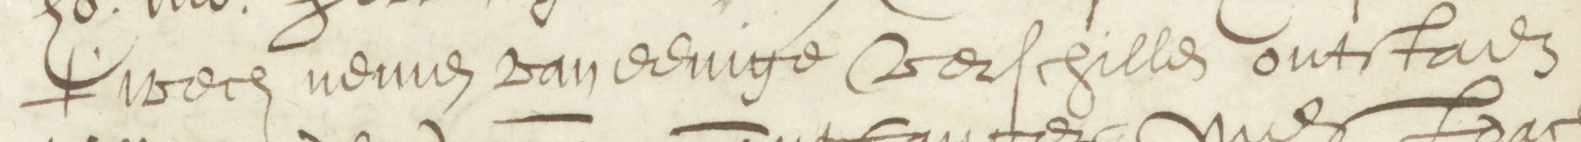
t'wech nemen van eenige verschillen ontstaen
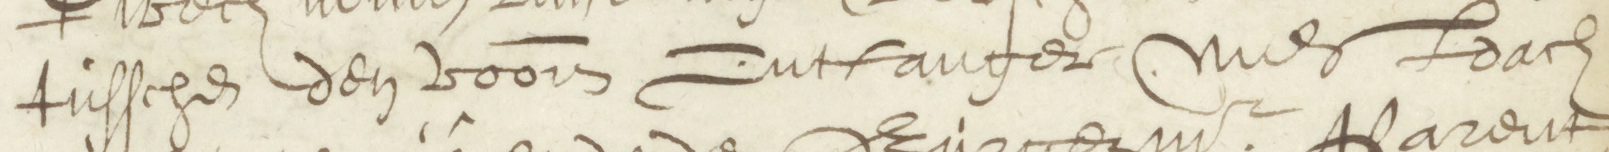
tusschen den voorn Ontfanger mestdach
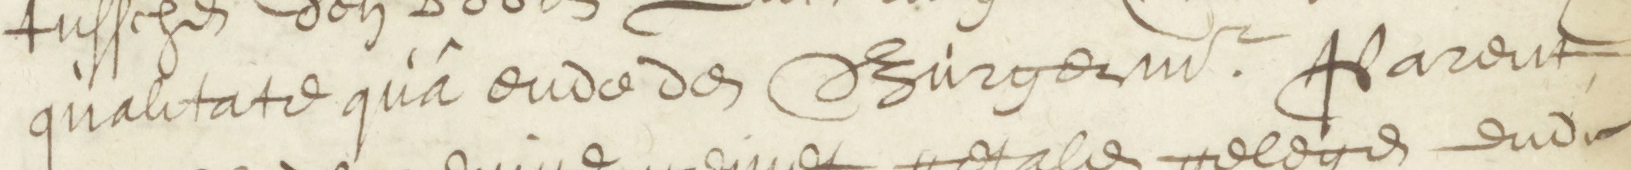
qualitate quâ ende den Burgermr. Parent,
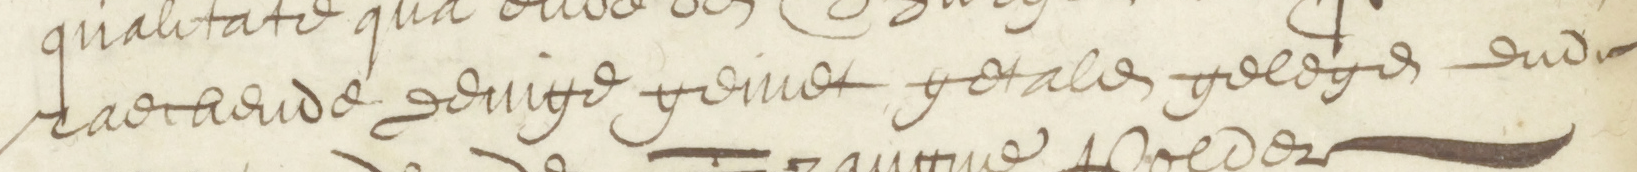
raeckende eenige gemet getalen gelegen ende
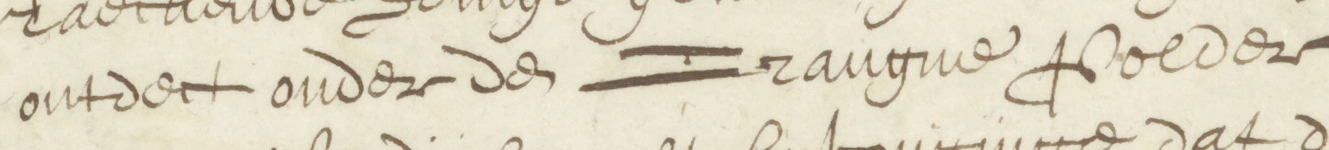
ontdect onder den Orangne Polder
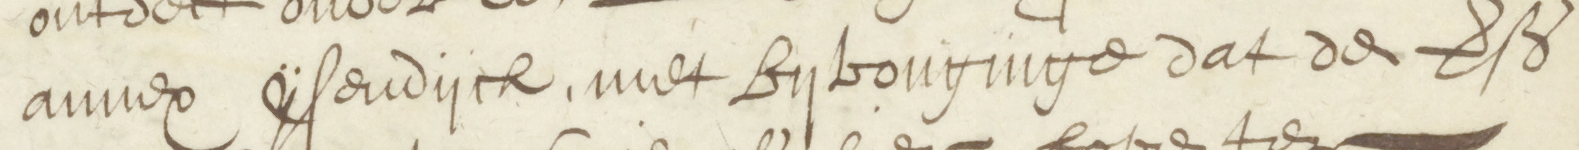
annex IJsendijck, met bijvouginge dat de vs
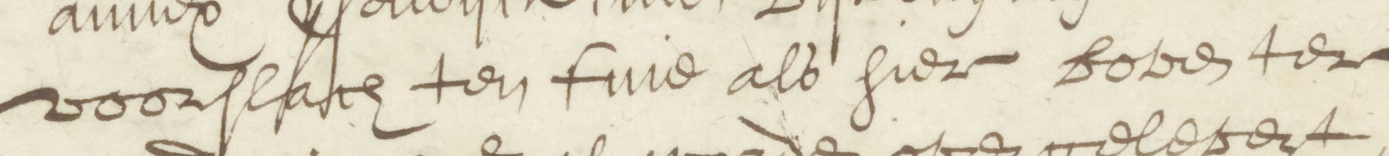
voorslach ten fine als hier boven ter
